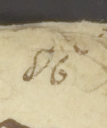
86
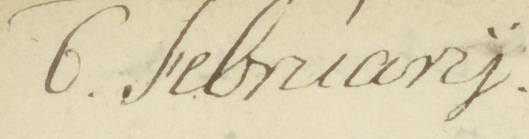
6. Februarij
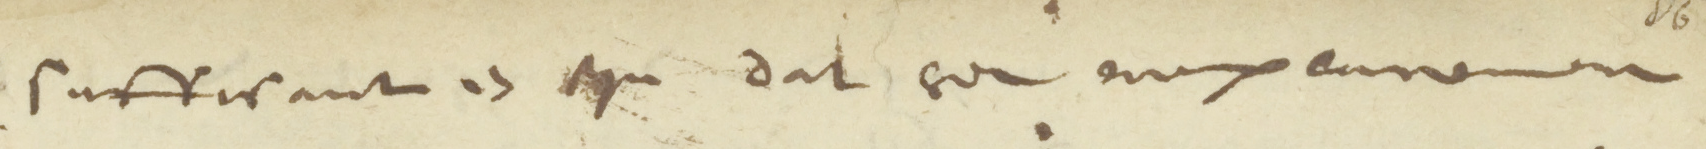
suffisant en syn dat het remplacement
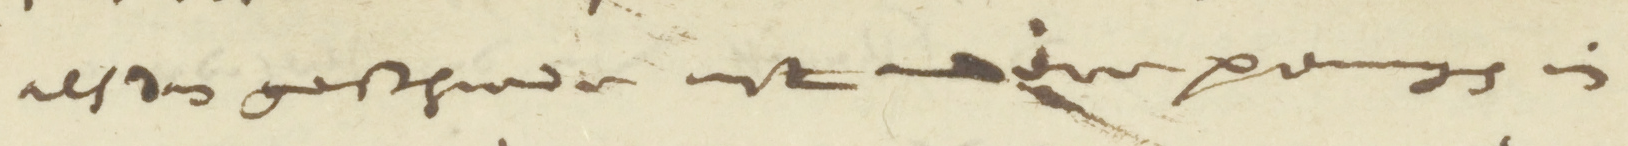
alsdan geschiede uyt andere penningen in
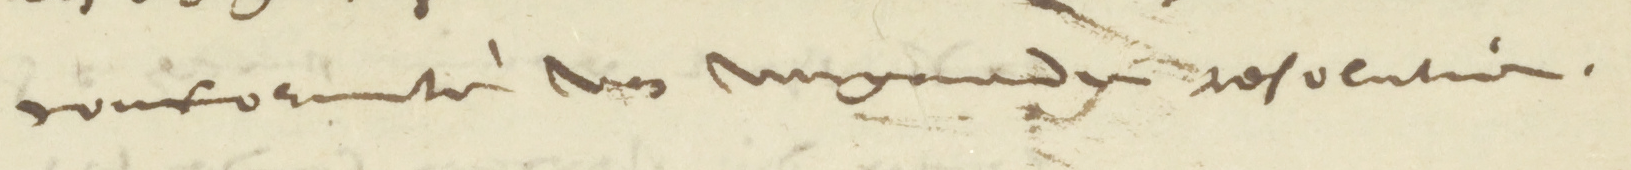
conformité van voorgaende resolutie.
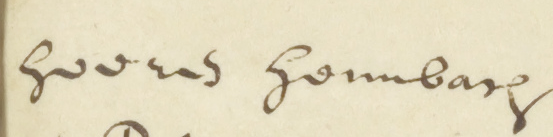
heeren Hembach
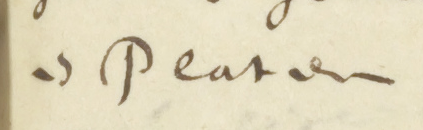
en Plater
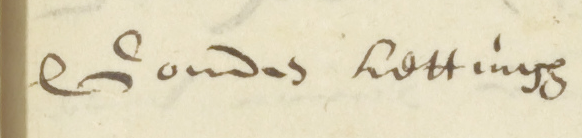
Gouden Kettingh
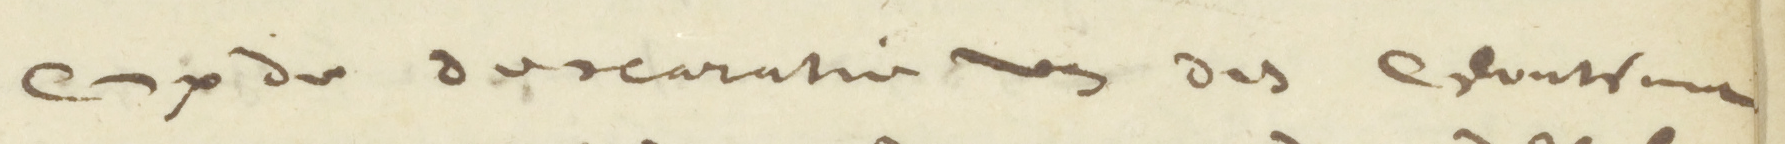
Op de declaratie van den Goutsmit
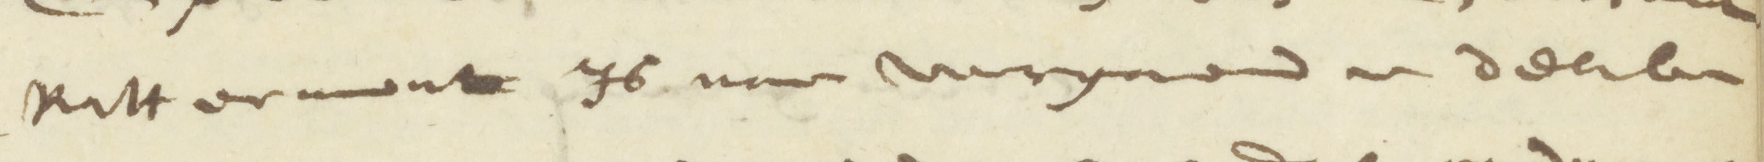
Rottermont is nae voorgaende delibe
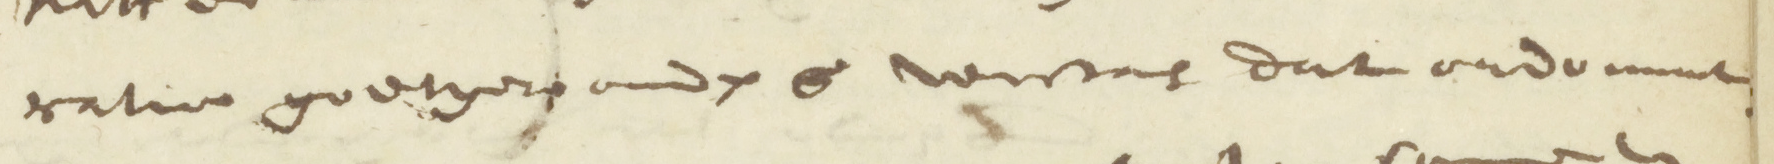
ratie goetgevonden & verstaen dat ordonnantie
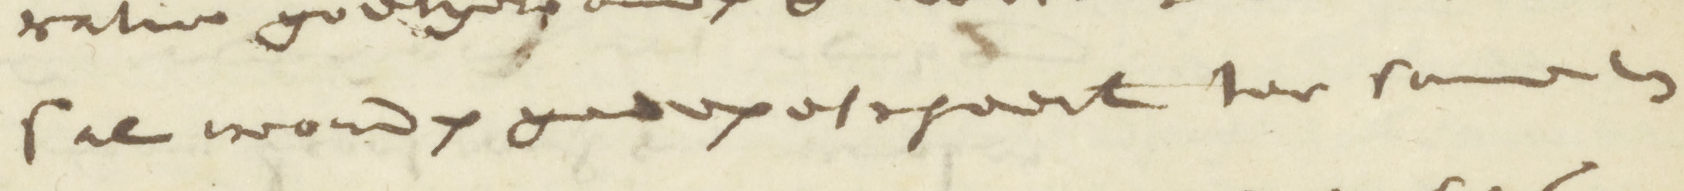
sal worden gedepescheert ter somme van
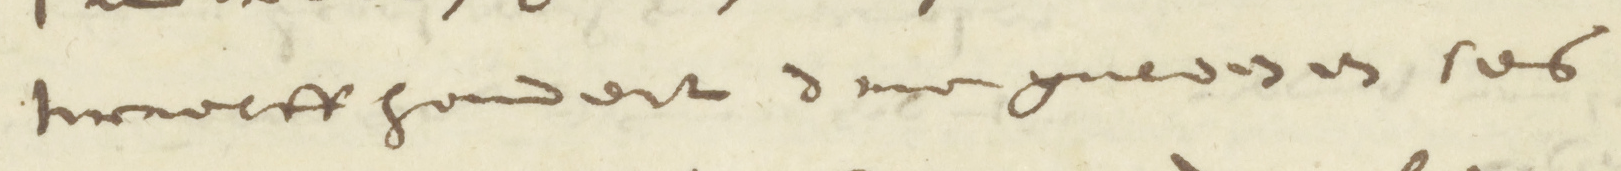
twaelff hondert drie gulden en ses
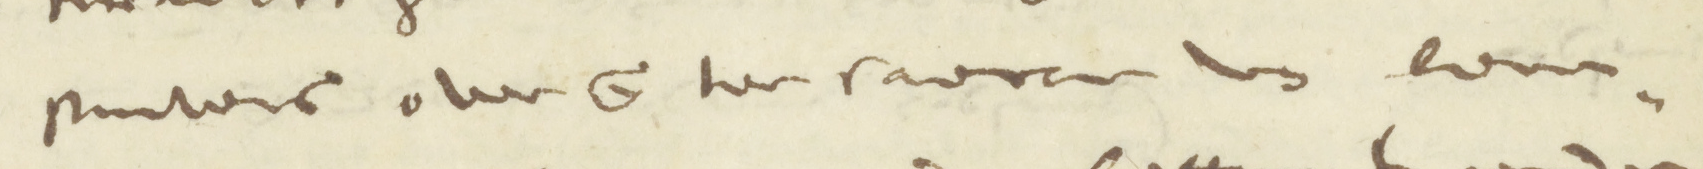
stuivers over & ter saecke van leve,,
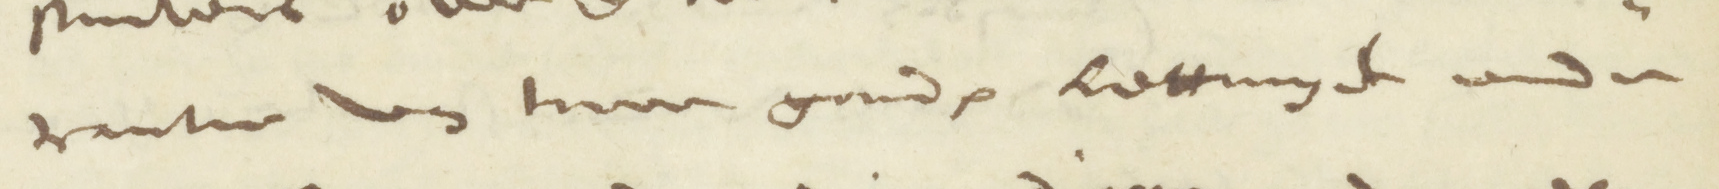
rantie van twee gouden kettingen ende
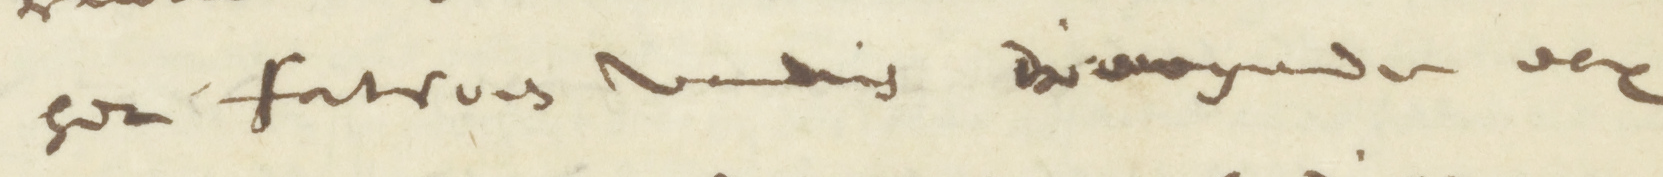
het fatsoen vandien die wegende elx
